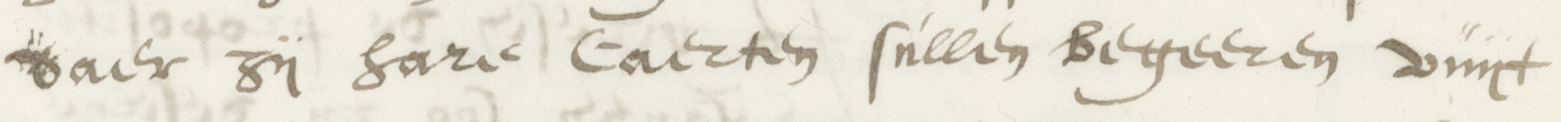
daer zij hare Caerten sullen begeeren vuijt
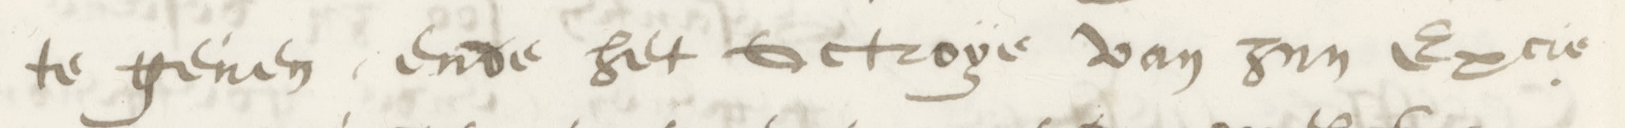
te geuen, ende het Octroije van hun Excie
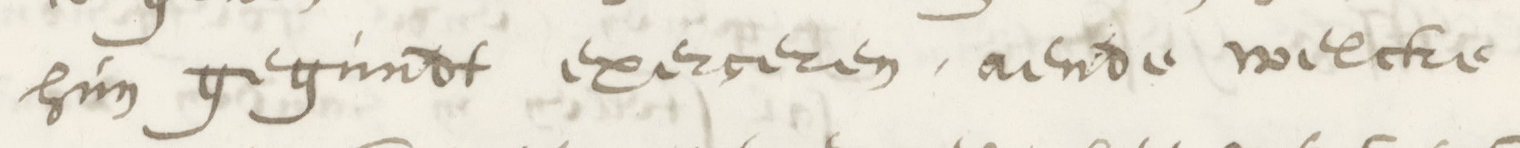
hun gegundt exerteren, aende welcke
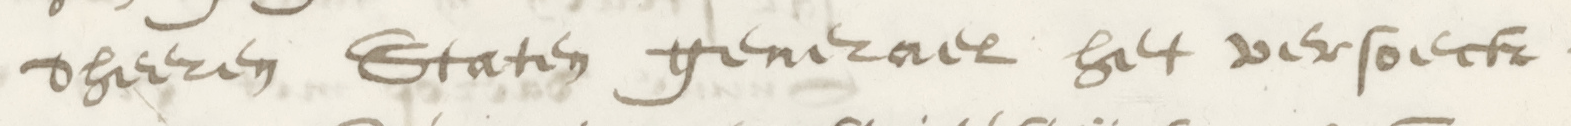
dheeren Staten generael het versoeck
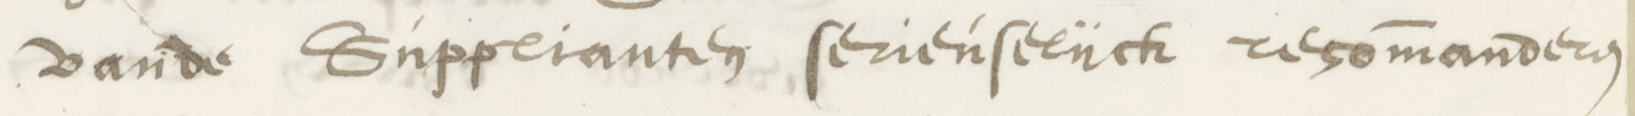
vande Supplianten serieuselijck recomanderen
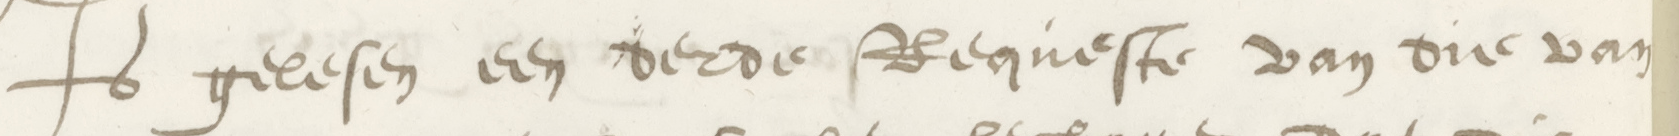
Is gelesen een derde Requeste van die van
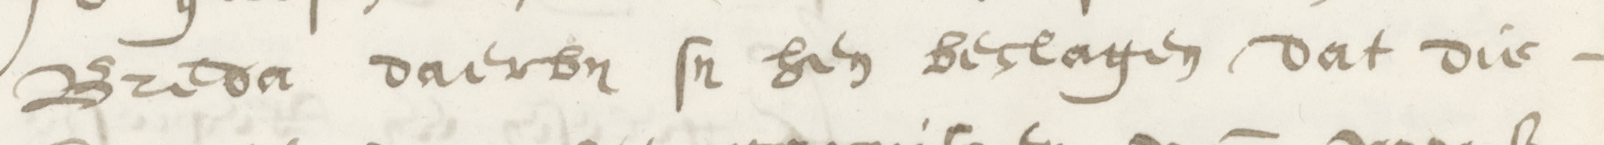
Breda daerby sy hen beclagen, dat die
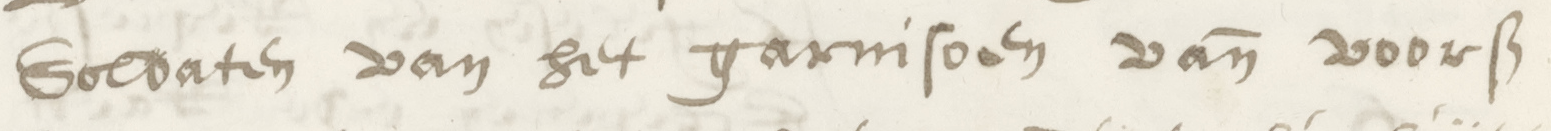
Soldaten van het garnisoen van voors
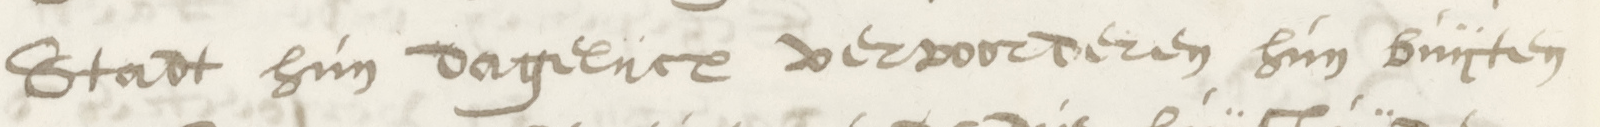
Stadt hun dagelijcx vervoorderen hun buijten
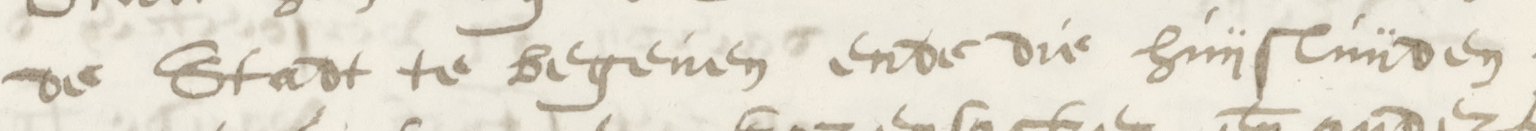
de Stadt te begeuen ende die huijsluijden
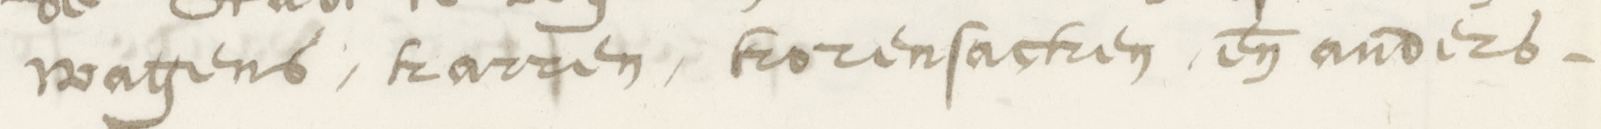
wagens, karren, korensacken, en anders
